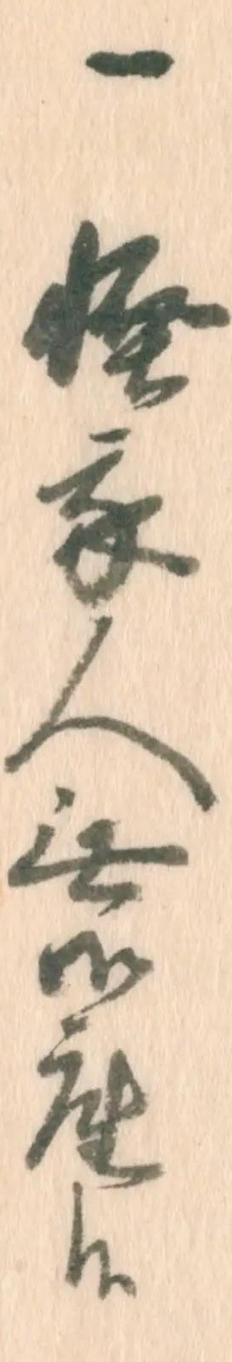一怪我人無御座候
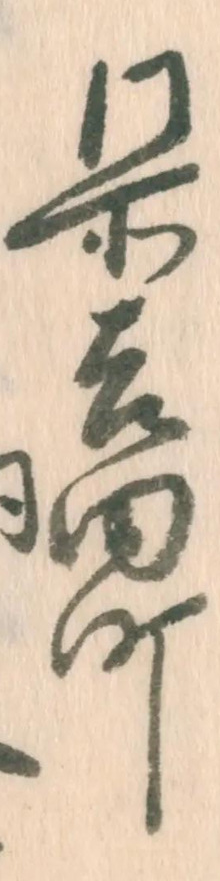同所吉田町
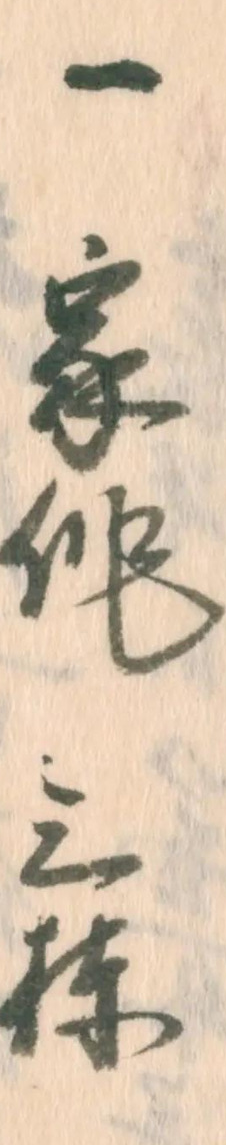一家作三棟
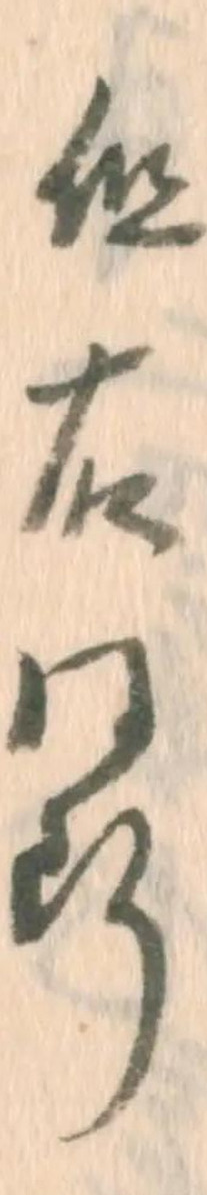但右同断
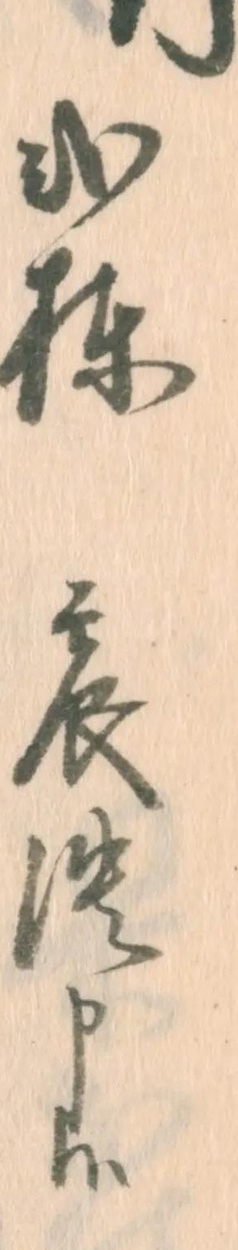弐棟震潰申候
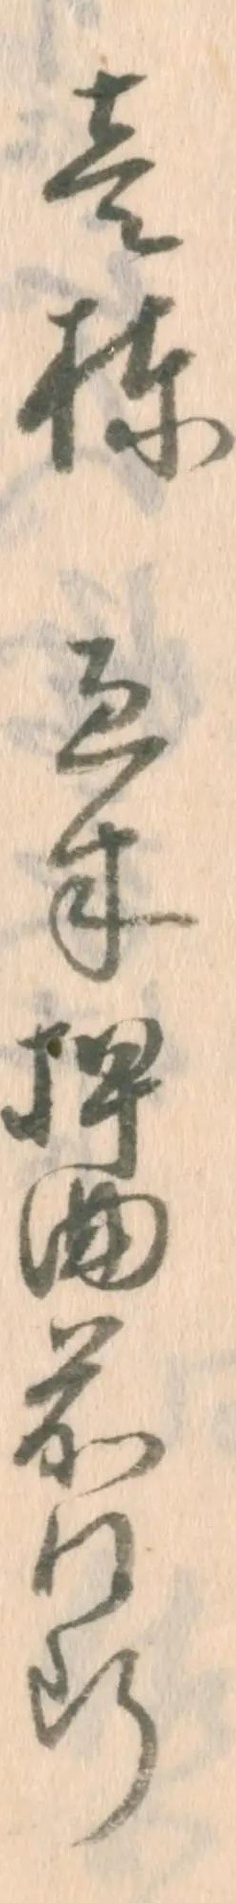壱棟過半押曲前同断
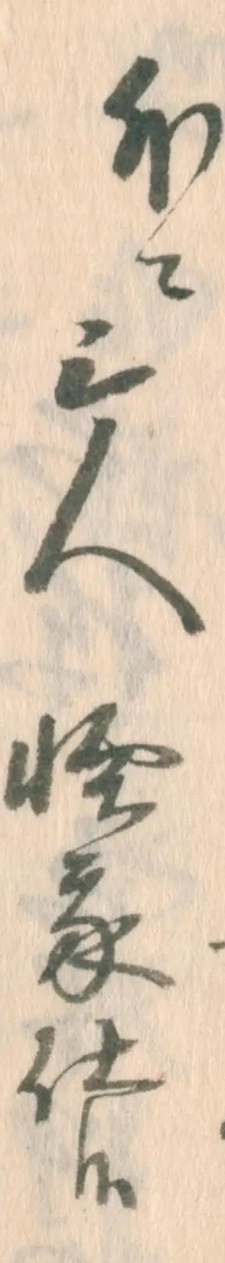外ニ三人怪我仕候
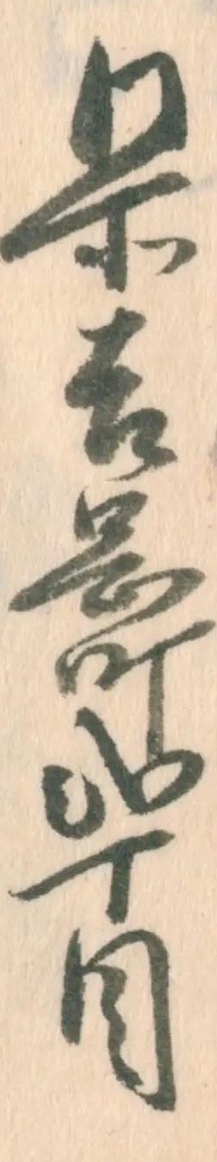同所吉岡町弐丁目

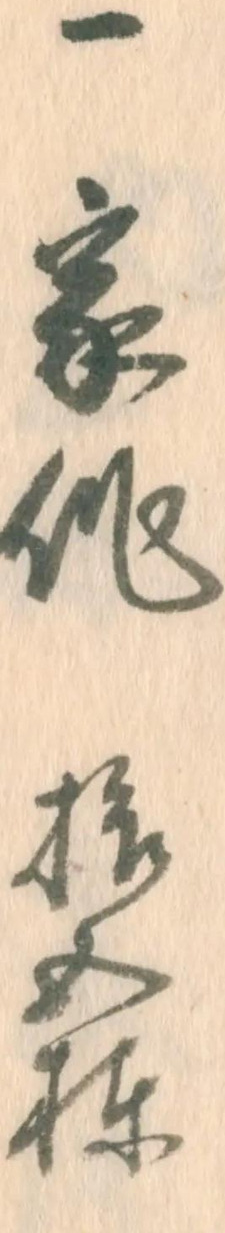一家作拾五棟
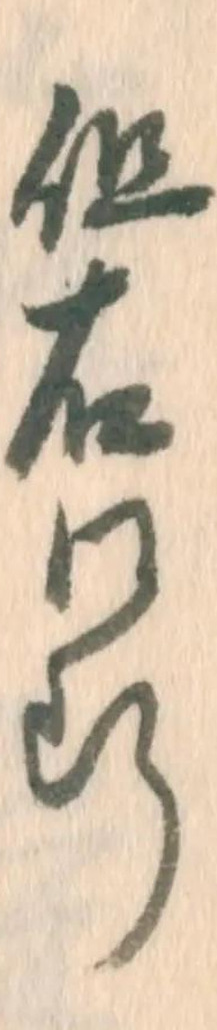但右同断
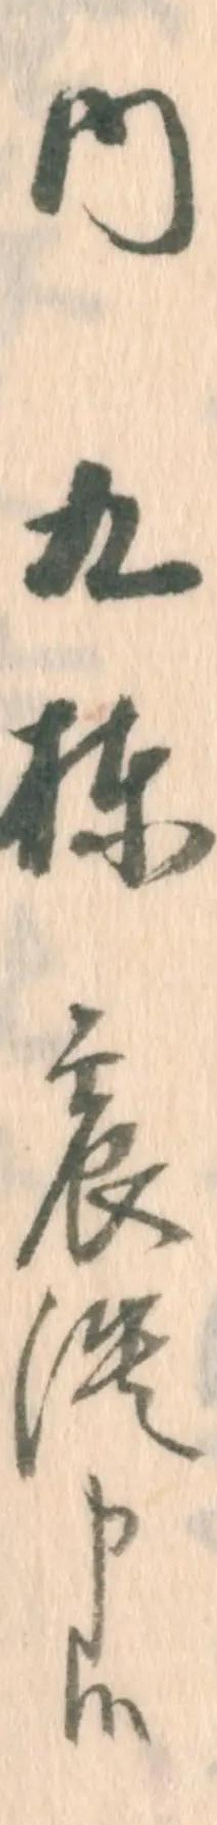内九棟震潰申候
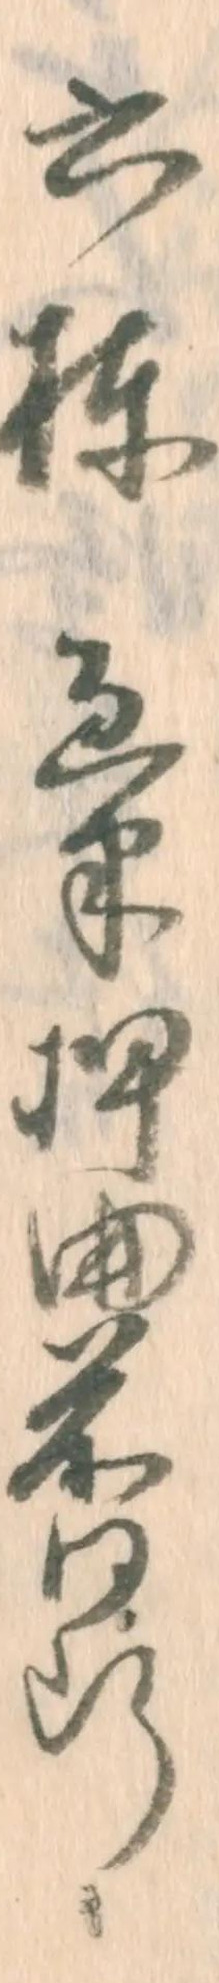六棟過半押曲前同断
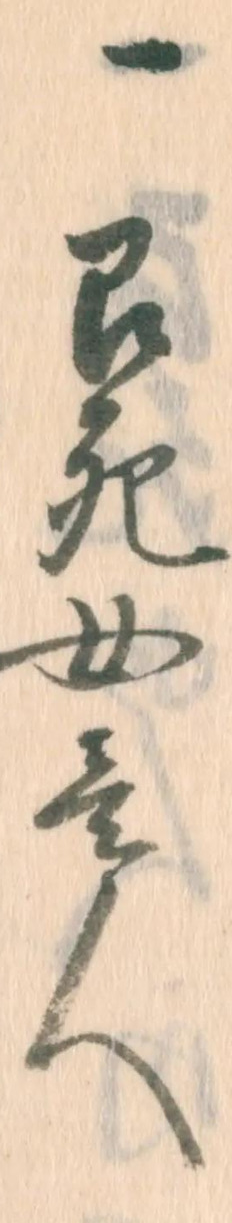一即死女壱人
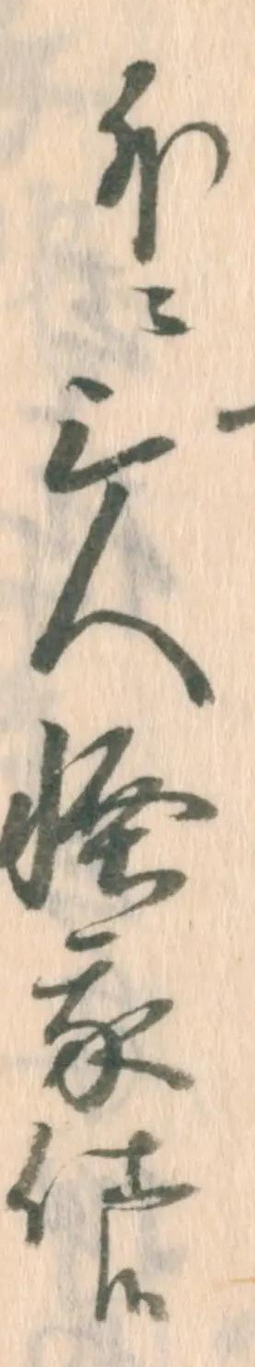外ニ三人怪我仕候
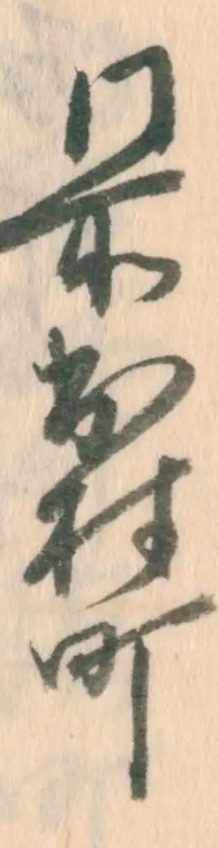同所出村町
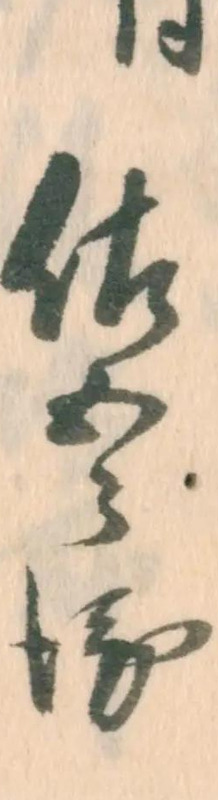同佐五兵衛
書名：地震災書留 2巻. [1] 内表紙に「地震災書留　安政二卯年　但本所深川御用屋敷地代免除調」とあり
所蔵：国立国会図書館 National Diet Library, JAPAN
